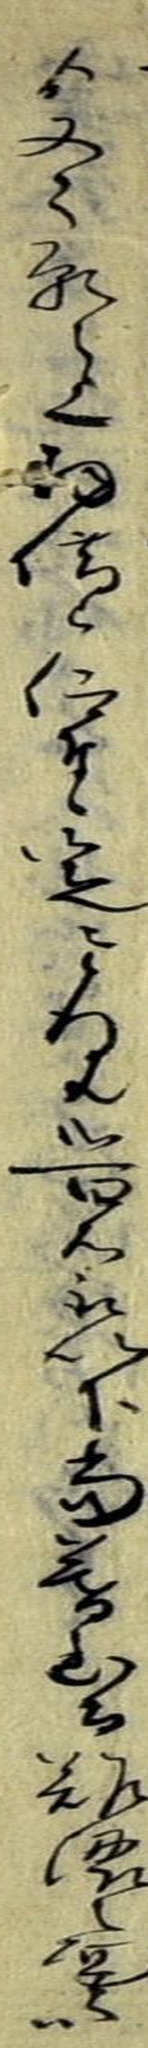ゟ又々願之上拝借被仰付候定に候得共弐百石取以下当暮至而難渋之面々は

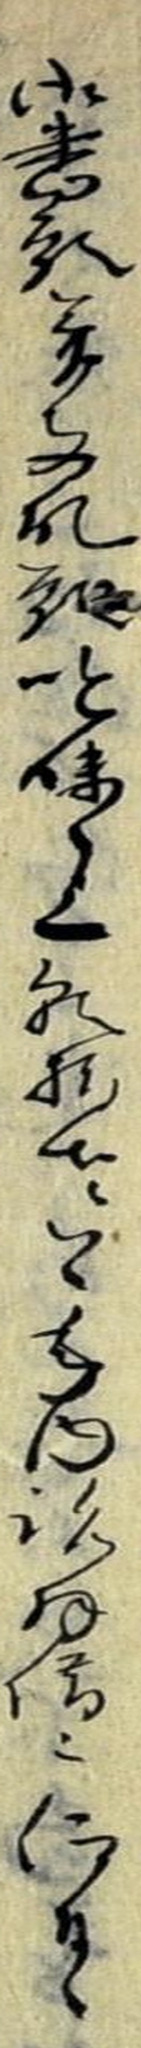御番頭并支配頭吟味之上願指出候はヽ年内弥拝借被仰付候
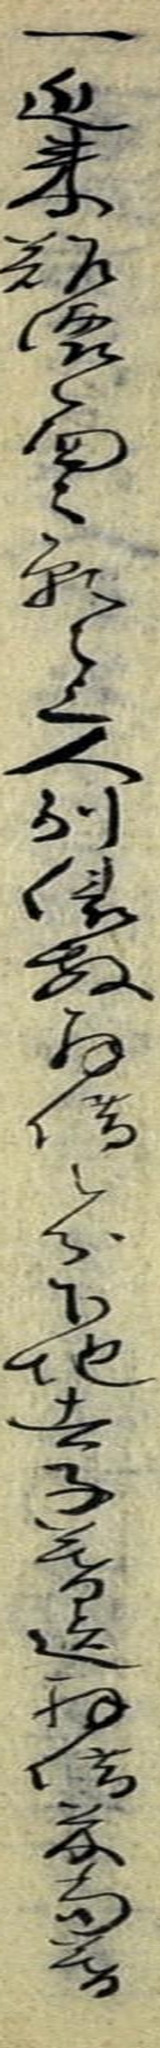一近来難澁之面々願之上人別俵数拝借之分下地去子暮迄拝借米当暮
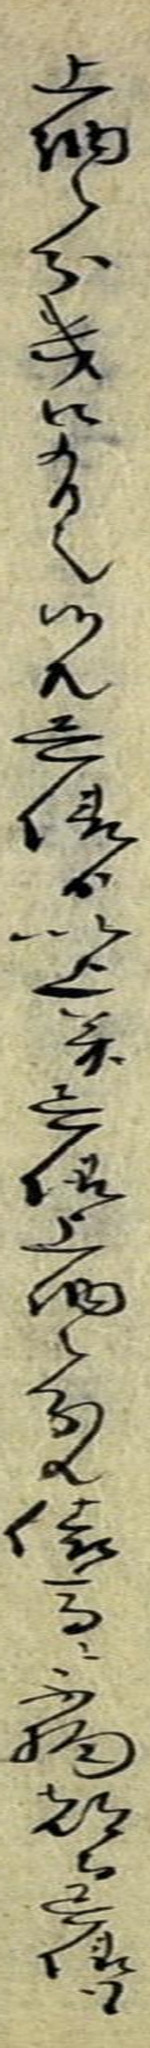上納之分幾口有之候共壱俵ゟ以上并壱俵上納之分共俵高に不拘都而壱俵つヽ
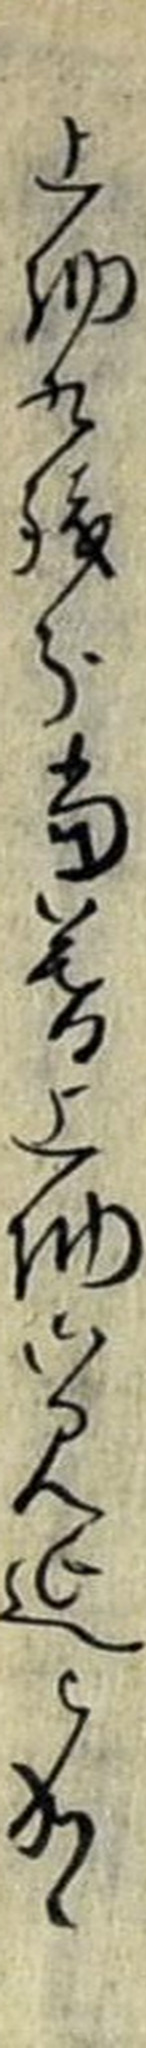上納相残分当暮上納御見延被成候
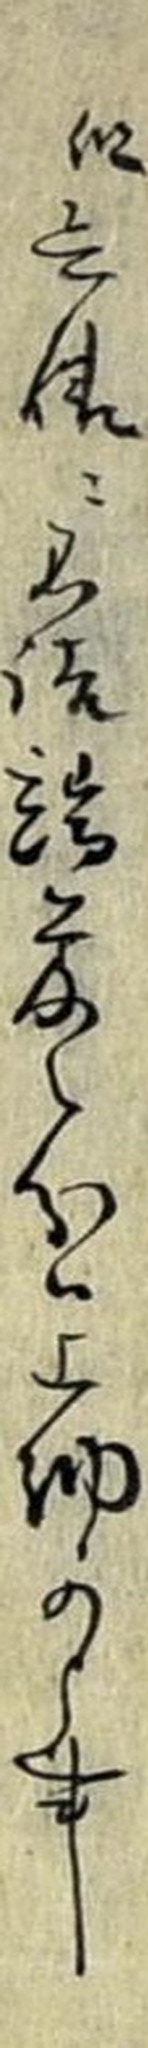但壱俵に不詰端米之分は上納可申事
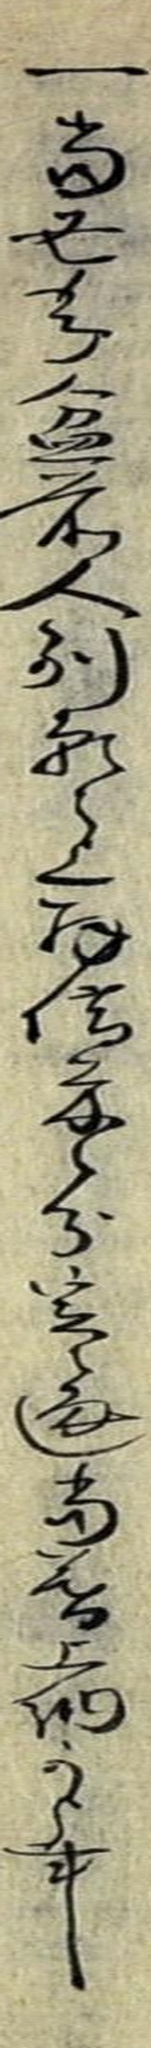一当丑年盆前人別願之上拝借米之分定之通当暮上納可申事
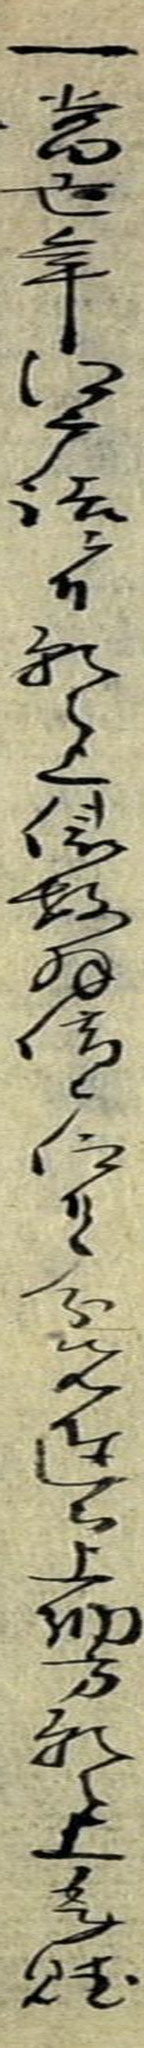一当丑年江戸詰に付願之上俵数拝借被仰付候分先達而上納方願之上年賦
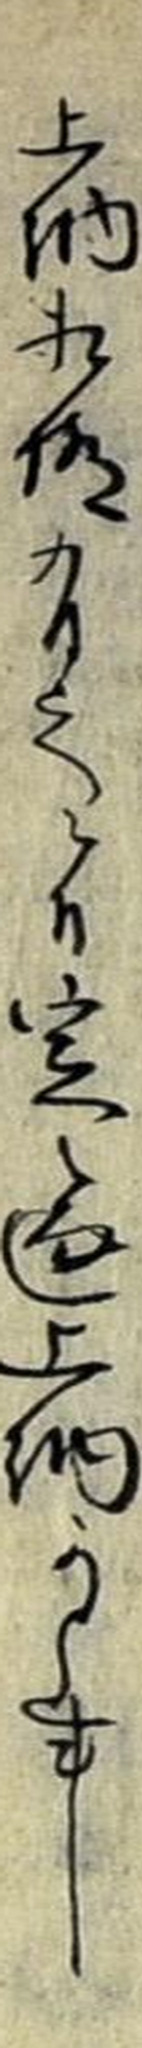上納相極有之に付定之通上納可申事
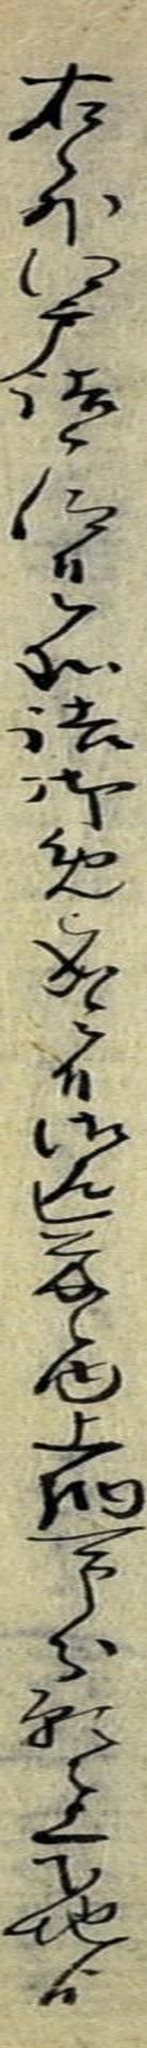右之外江戸詰被仰付候処詰御免被成候に付御返米之内上納可申分願之上下地ゟ
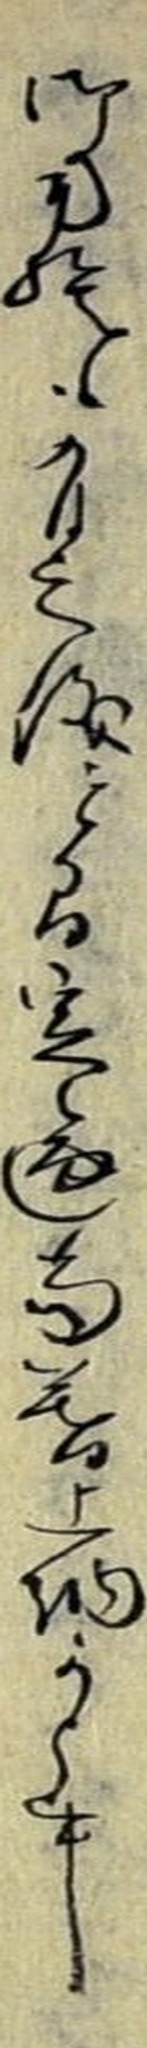御用捨も有之儀に候間定之通当暮上納可申事
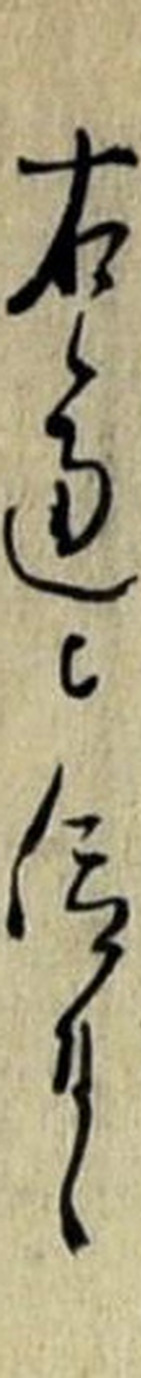右之通被仰付候
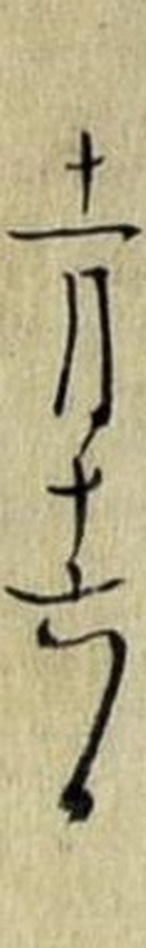十一月十六日
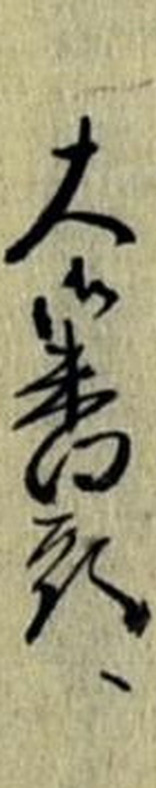大御番頭へ
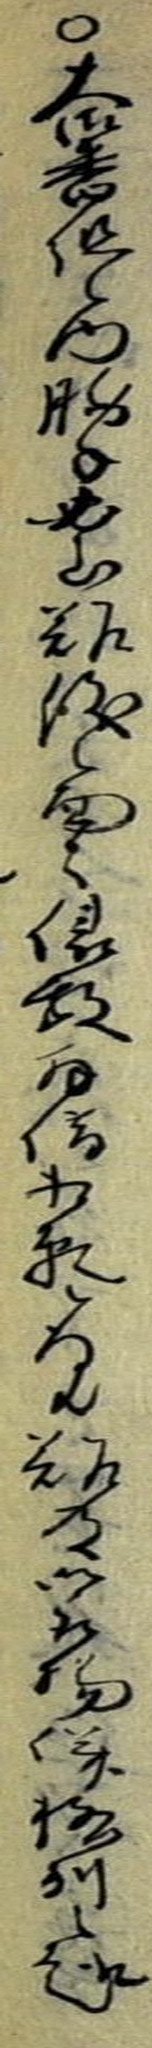○大御番組之内勝手必至難儀之面々俵数拝借相願候得共難及御取揚併格別之趣
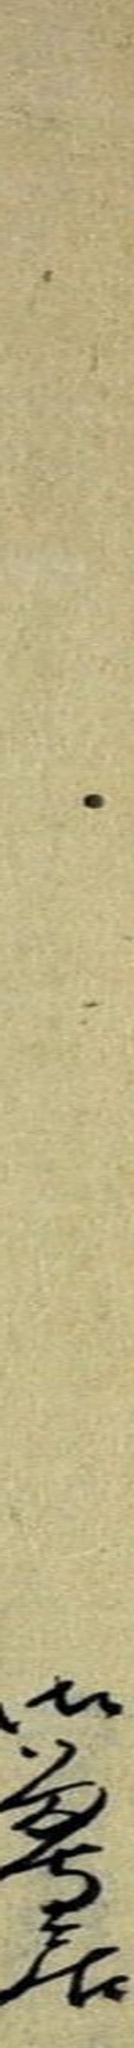御留守居
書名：命令之部 四
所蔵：福井県文書館 Fukui Prefectural Archives
